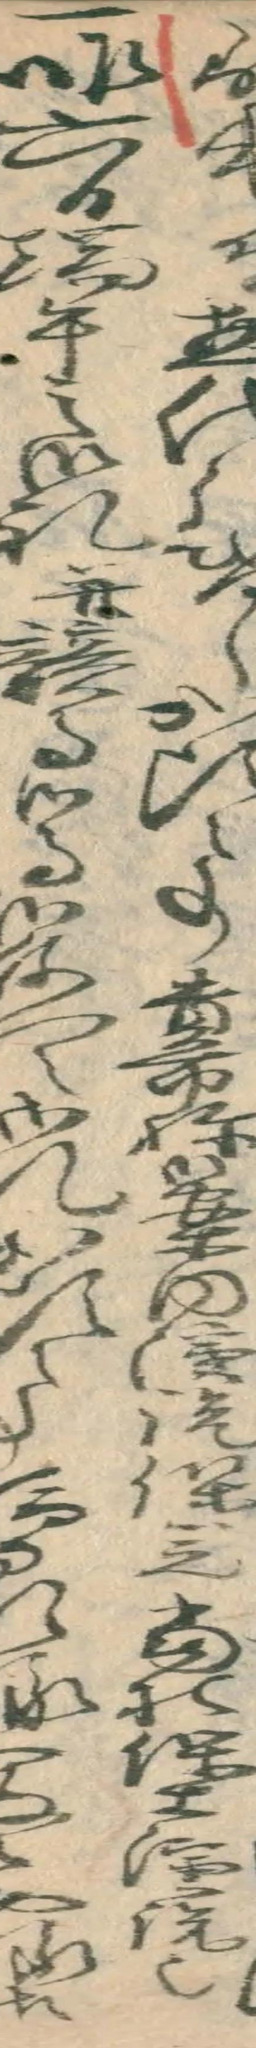一昨六日端午之御礼并競馬御馬御役人之御礼出頭之事掃部頭様富之助様御
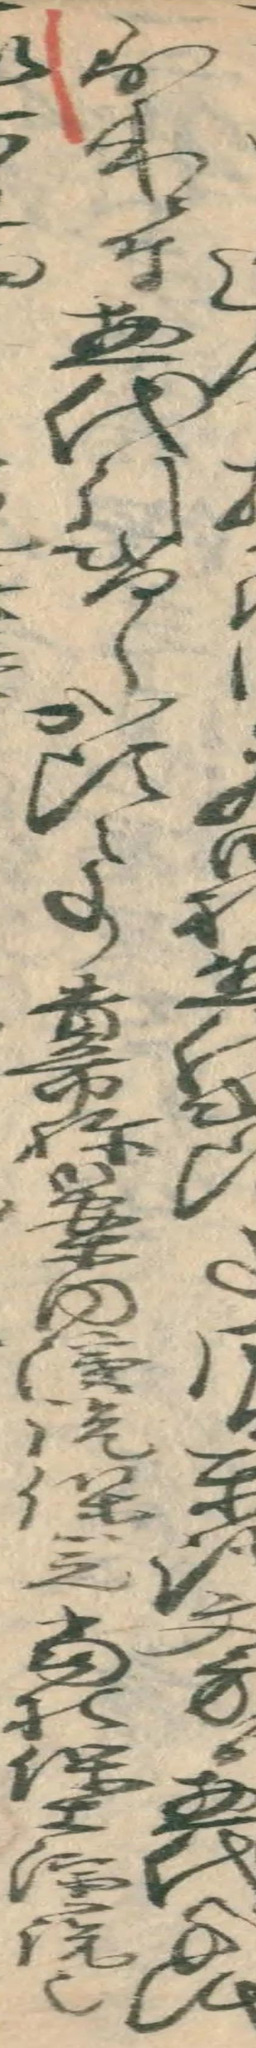到来ニ付惣代引替之出頭之事貴布祢御案内演説保覚当社保土演説也
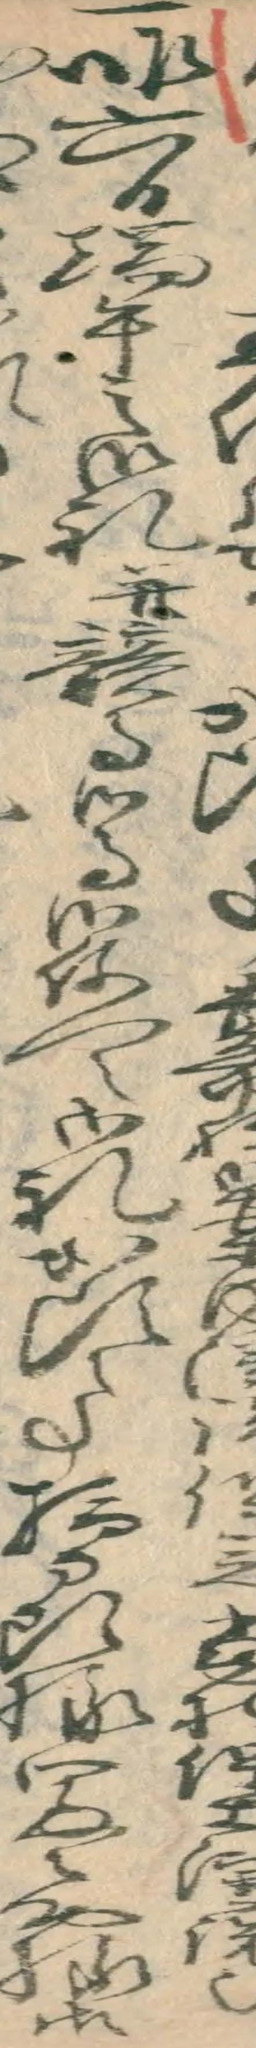一昨六日端午之御礼并競馬御馬御役人之御礼出頭之事掃部頭様富之助様御
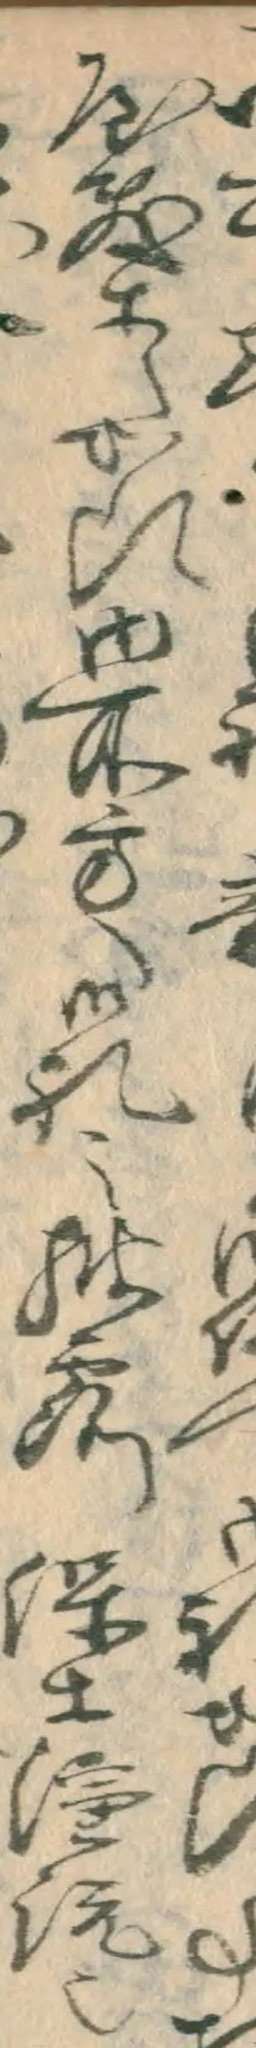屋敷等へ出頭御所方へ御礼之披露保土演説也
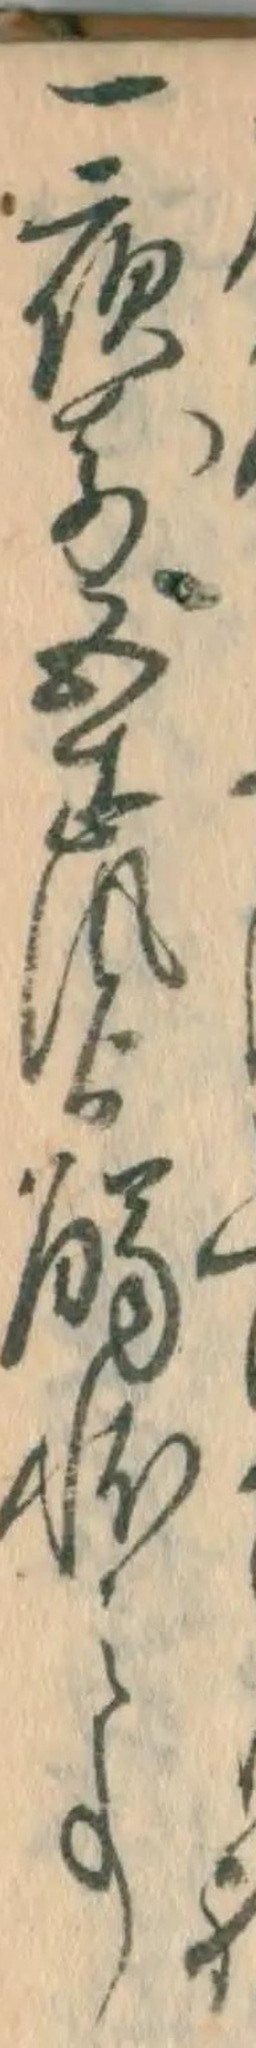一夜前五十風ゟ触状之事

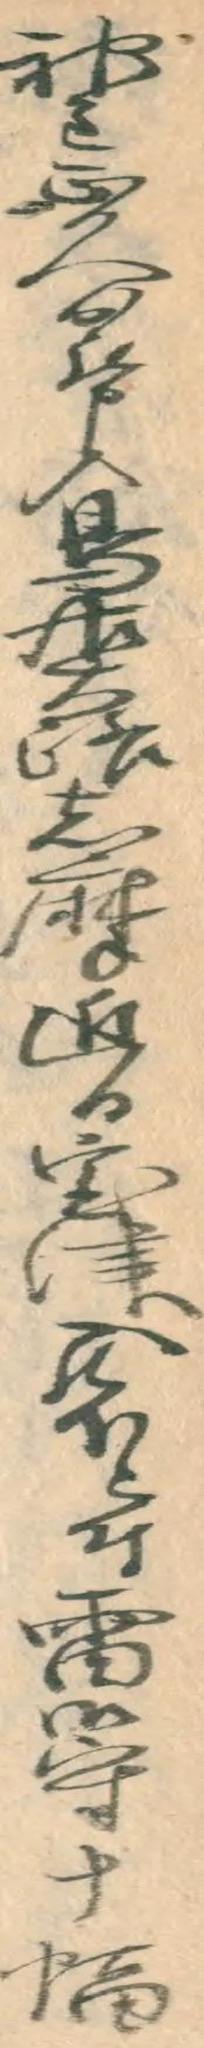一神主正久ゟ被申入鳥居大路志摩近日室津へ罷下候ニ付雷御守十幅
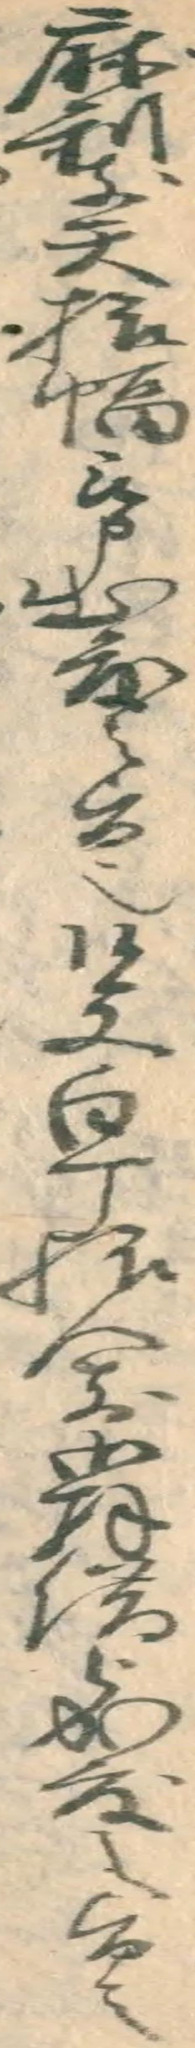麻利支天拾幅被申出度之旨也且又白丁拾人前御拝借被成度之旨之
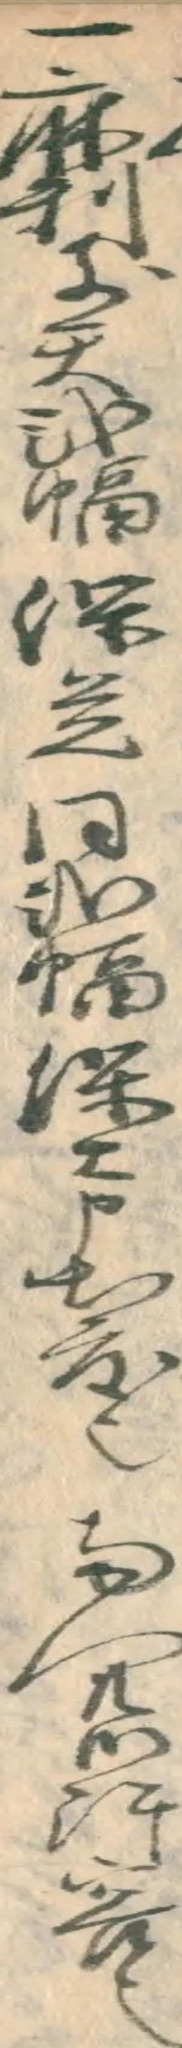一麻利支天弐幅保覚同弐幅保土申出度也両人共御許容也
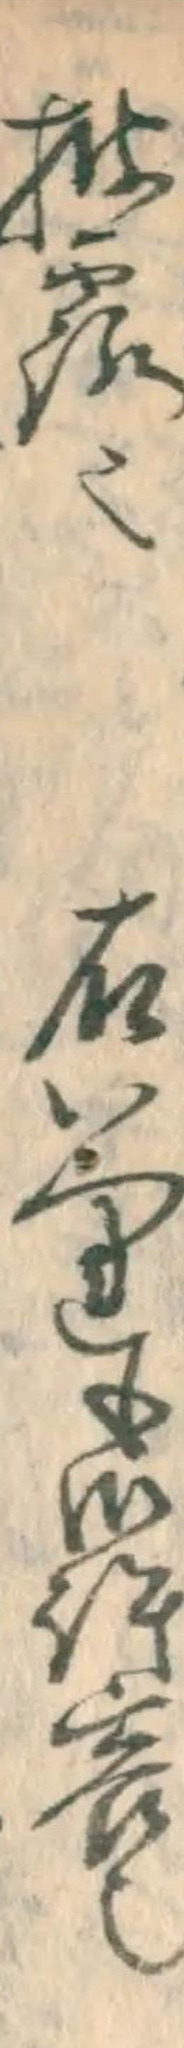披露也右いつれも御許容也
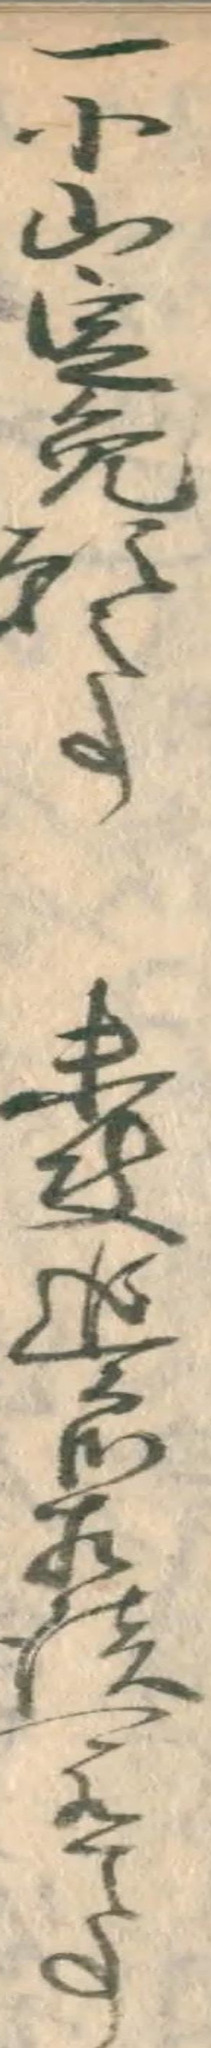一小山定免願之事末決追而御相談可有之事
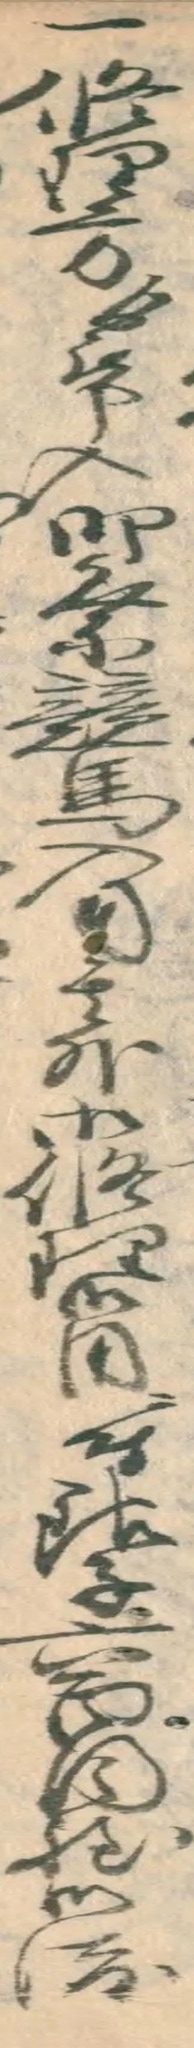一修理方ゟ被申入御祭競馬入用其外御修理御用ニ付銀子六百目程御渡
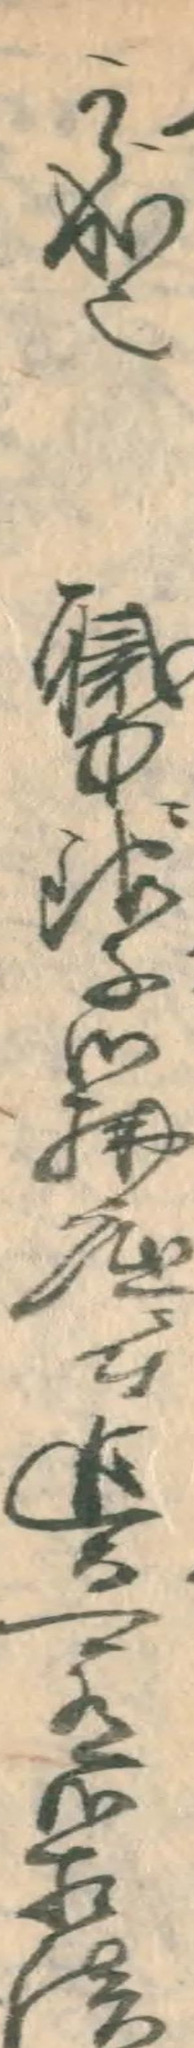可被成也職中ニ銀子御払底ニ付追而可有御相談也
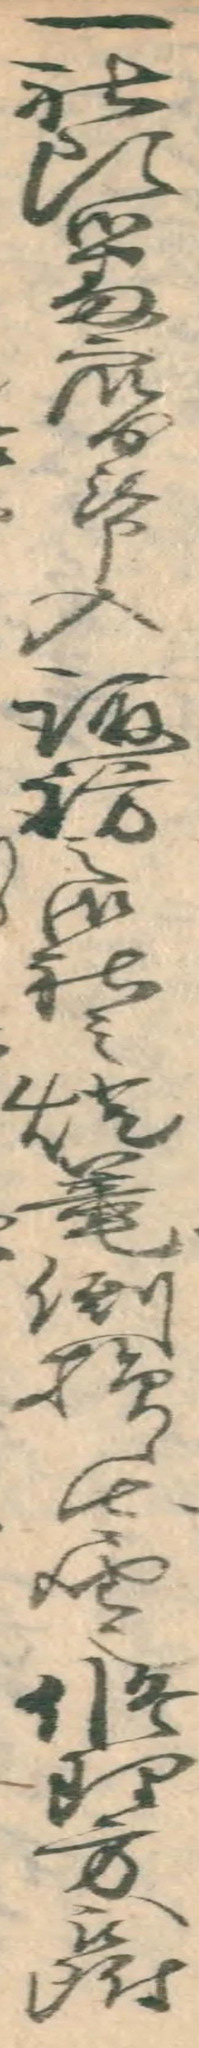一社頭御番衆ゟ被申入諏訪之御社之燈篭倒損候由届也修理方へ被付
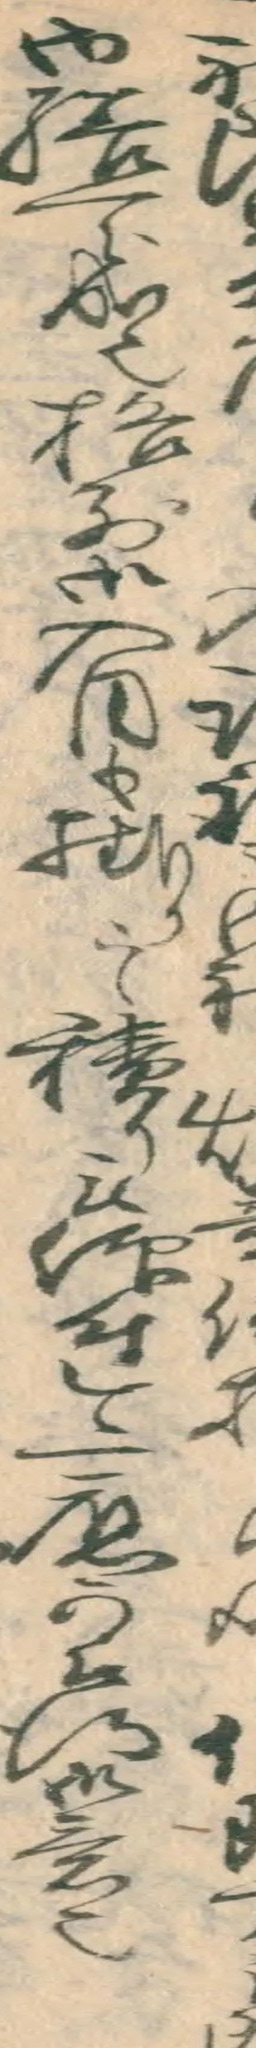御繕可被成也格別御入用も掛り候ハヽ積り被仰付今一応可被得御意也
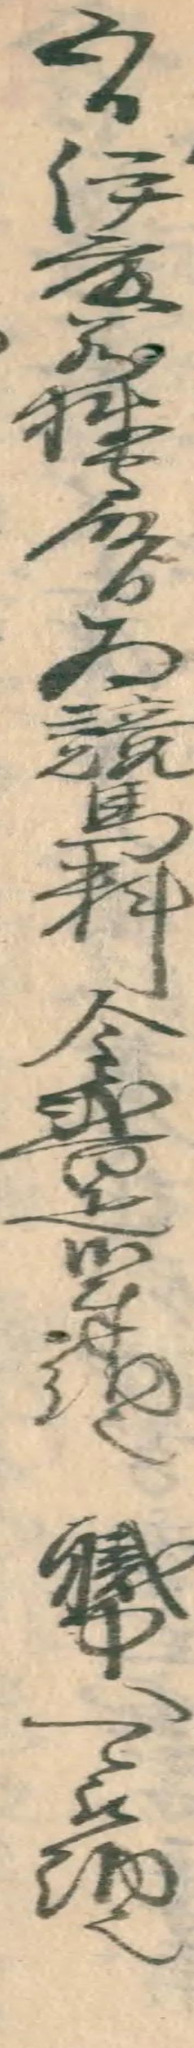一五日伊藤若狭守殿ゟ為競馬料金弐百疋御奉納也職中へ可被納也
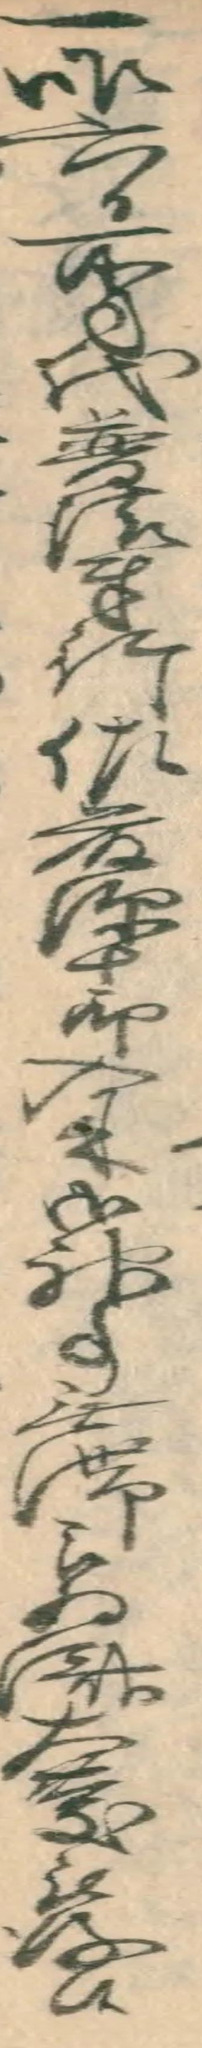一昨六日所司代普請奉行佐藤源十郎入来御神事無滞被為済大慶被存候
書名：賀茂社記録. 第58冊
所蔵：国立国会図書館 National Diet Library, JAPAN
